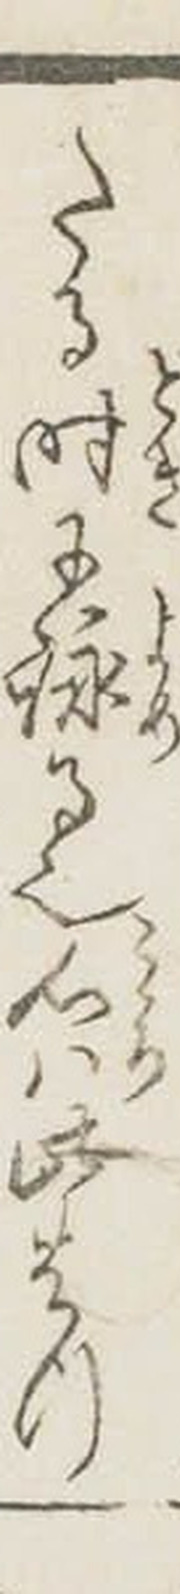たる時に詠る也心は此はつ
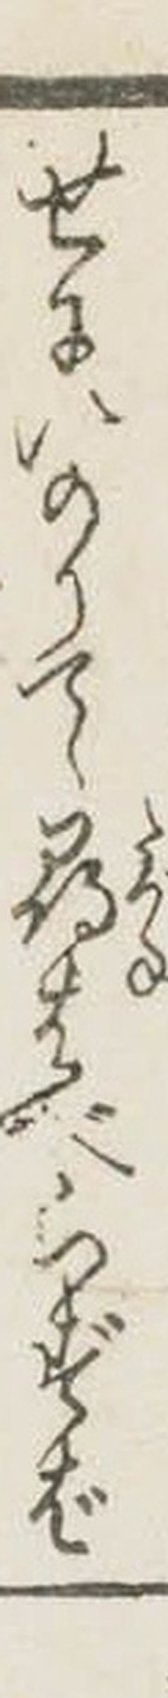せにいのりて尋はべらずば
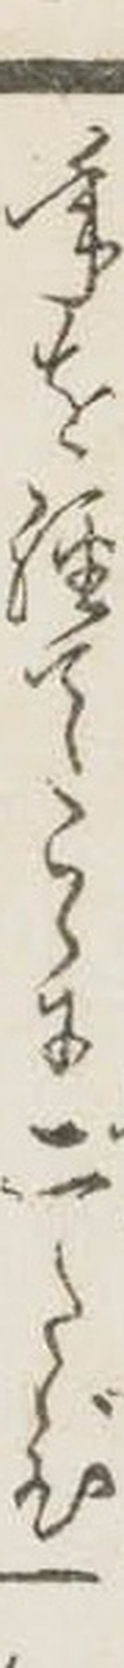年を経てこゝに二たび
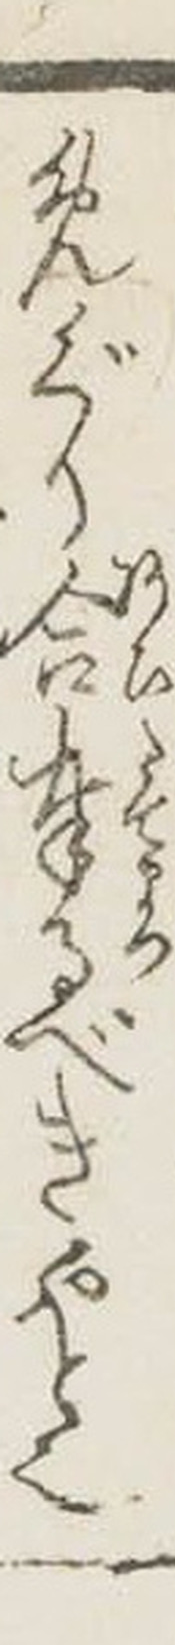めぐり合奉るべきやと也
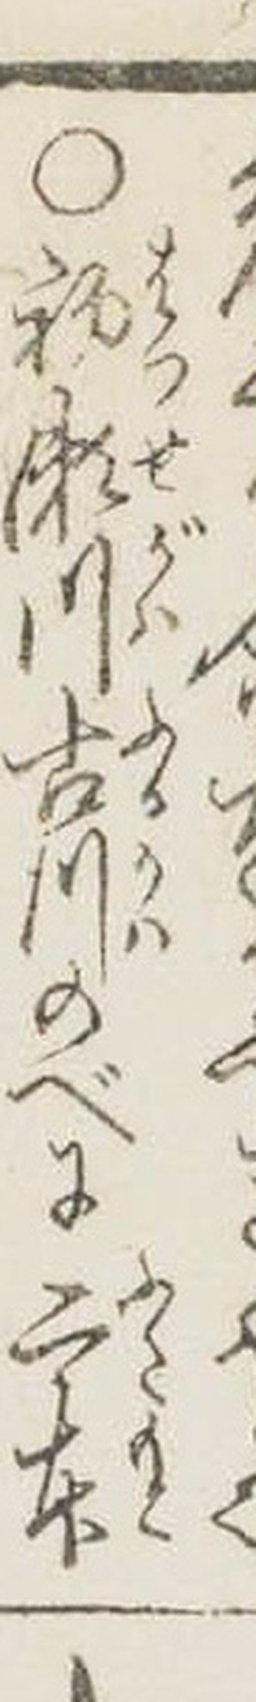○初瀬川古川のべに二本
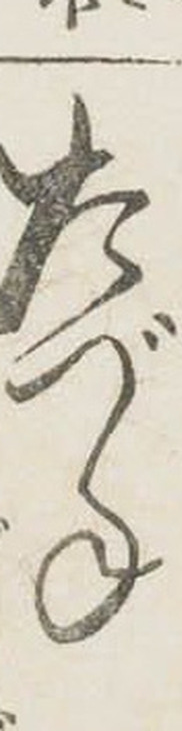たづね
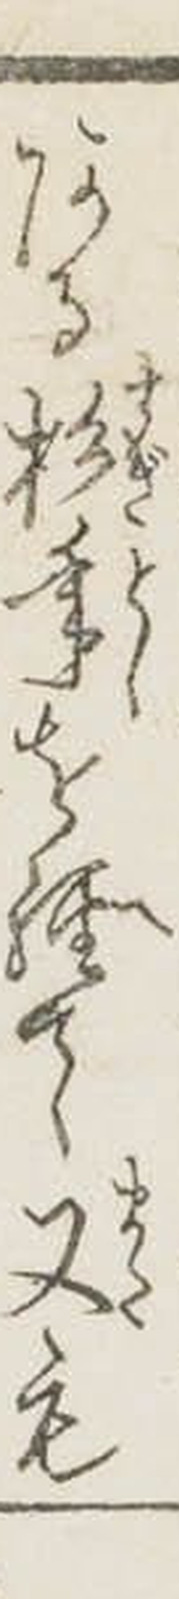ある杉年を経て又も
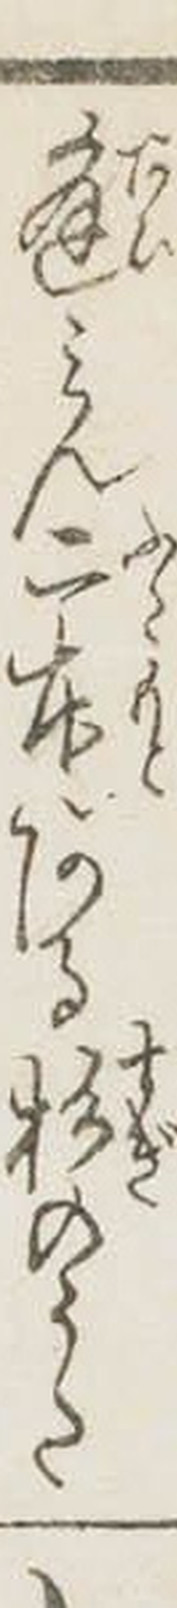逢みん二本ある杉のうた
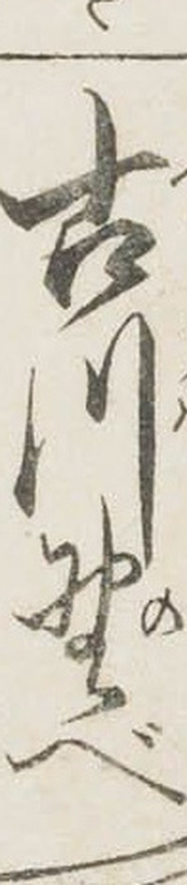古川野べ
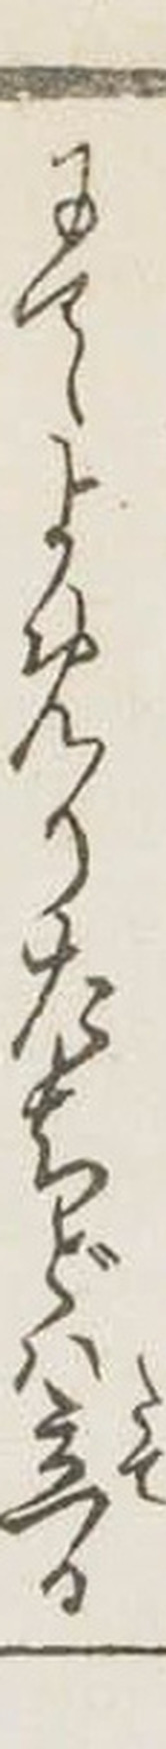にてよめりたちどは立る
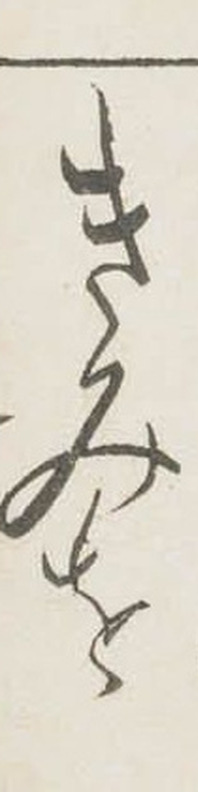きみを
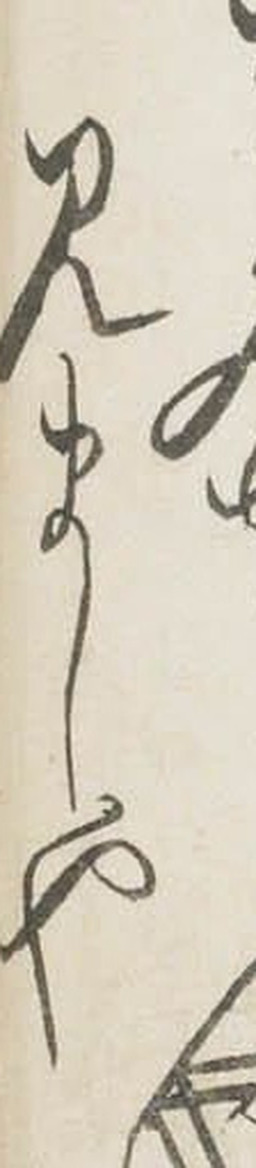見ましや
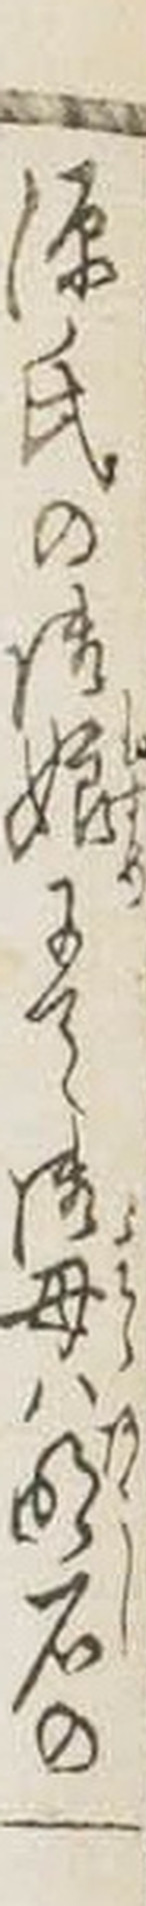源氏の御娘にて御母は明石の
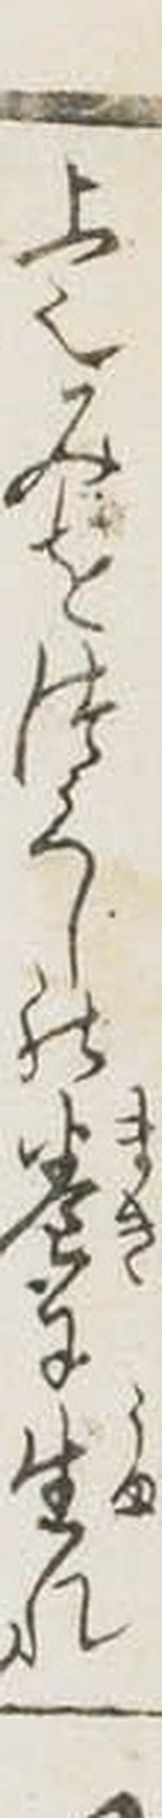上也みをつくしの巻に生れ
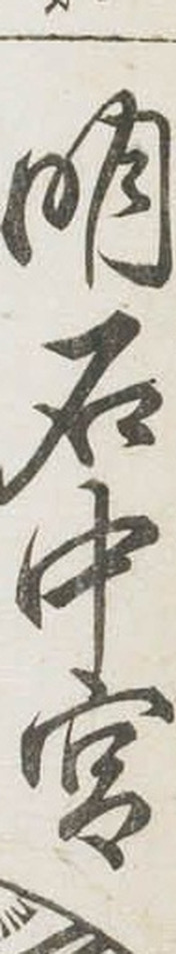明石中宮
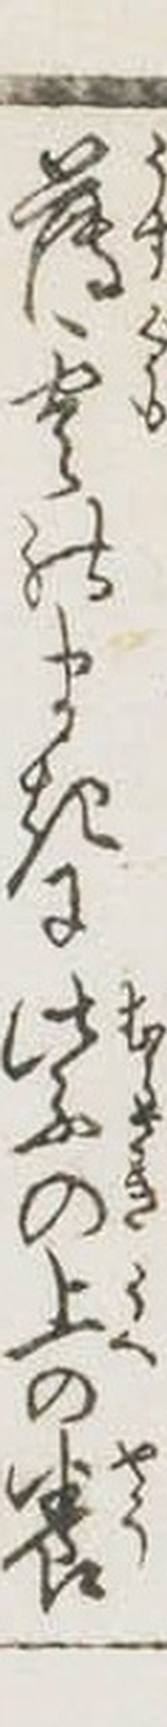薄雲のまきに紫の上の養
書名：源氏百人一首
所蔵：東京学芸大学教育コンテンツアーカイブ
